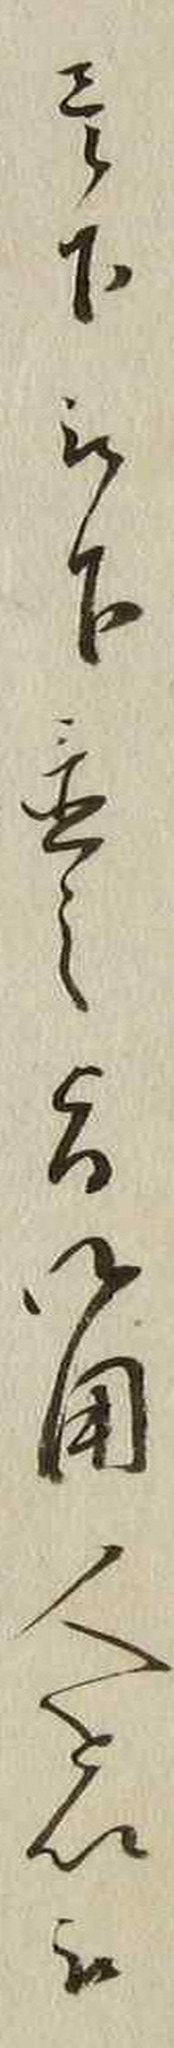壱下被下置之旨御用人を以被
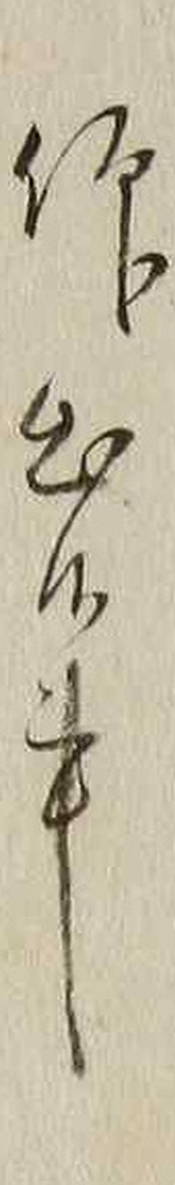仰出候事
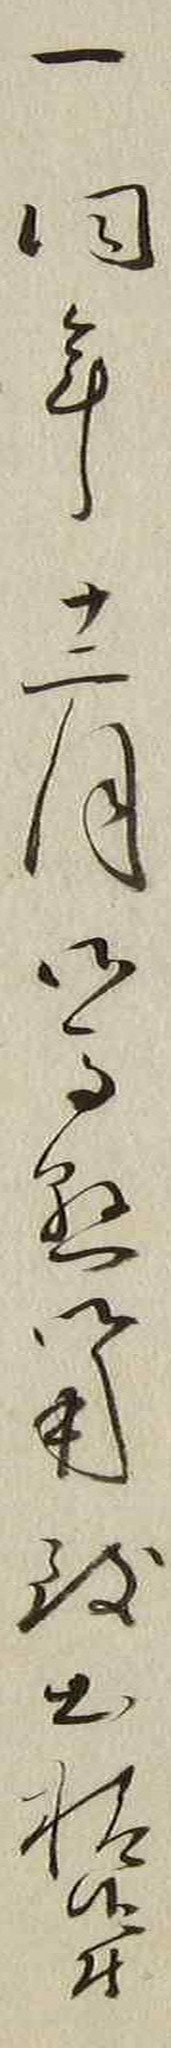一同年十二月御馬懸御用致出精候ニ付
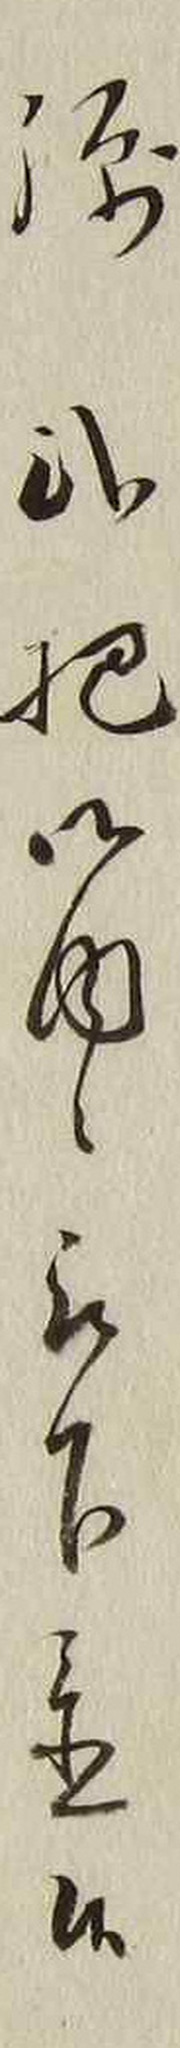綿弐把御内々被下置候
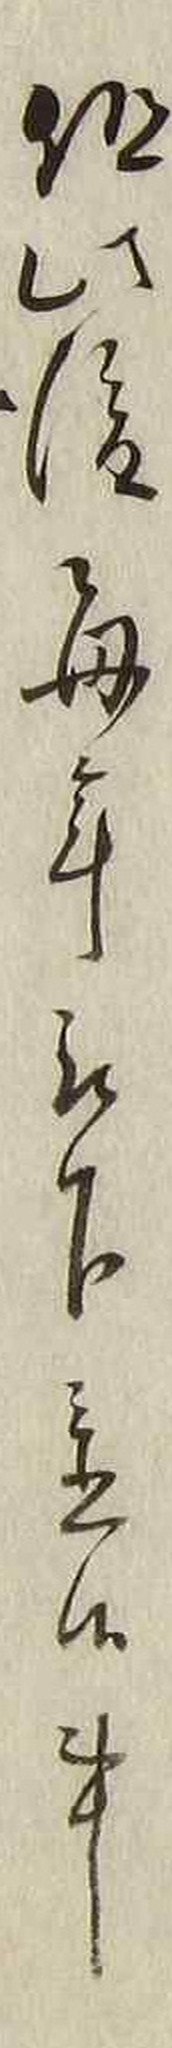但此後毎年被下置候事
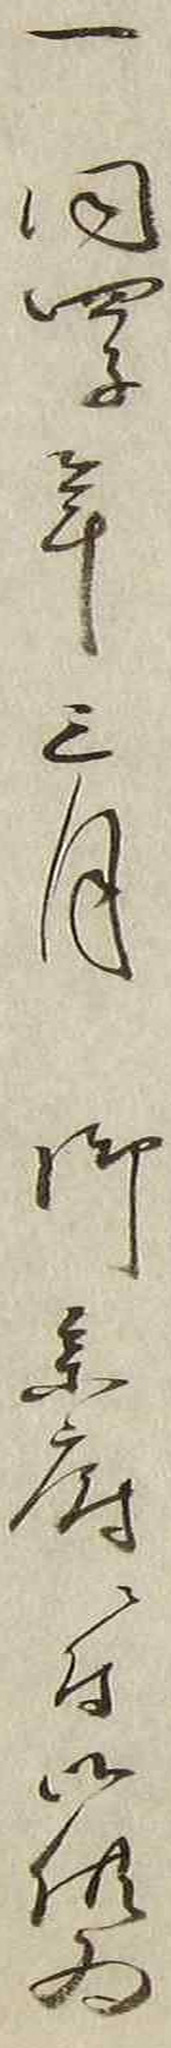一同四子年三月御参府ニ付御供為
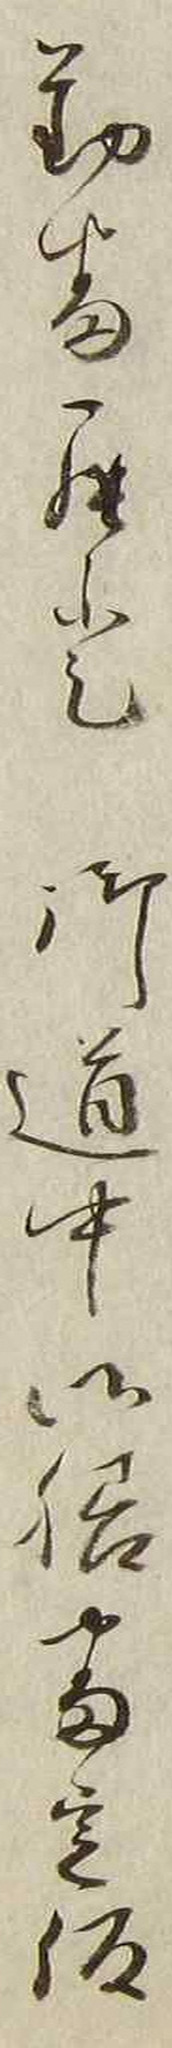勤番罷登御道中御膳番定仮
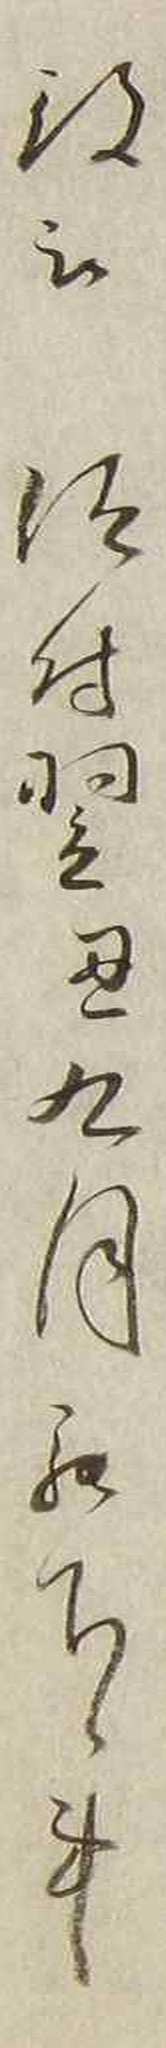役被仰付翌丑九月罷下候事

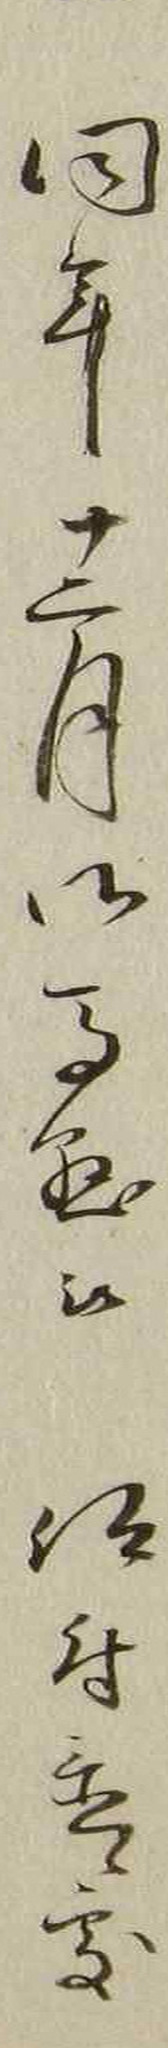一同年十二月御馬懸被仰付置候処
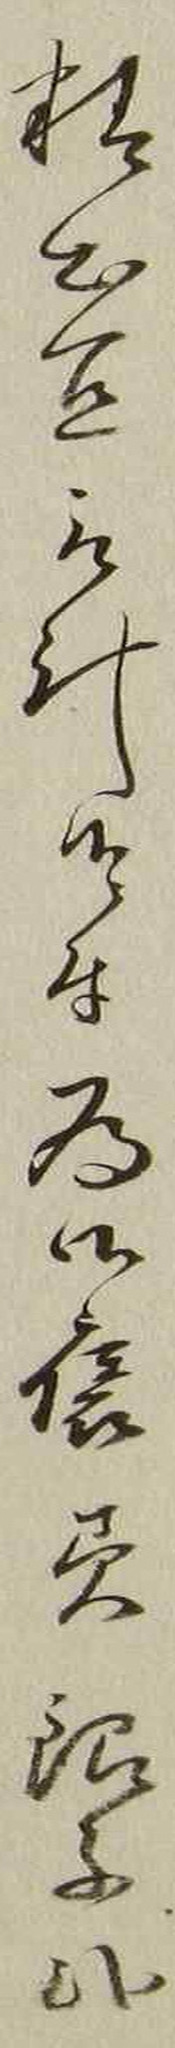精出宜取計候ニ付為御褒美銀子弐
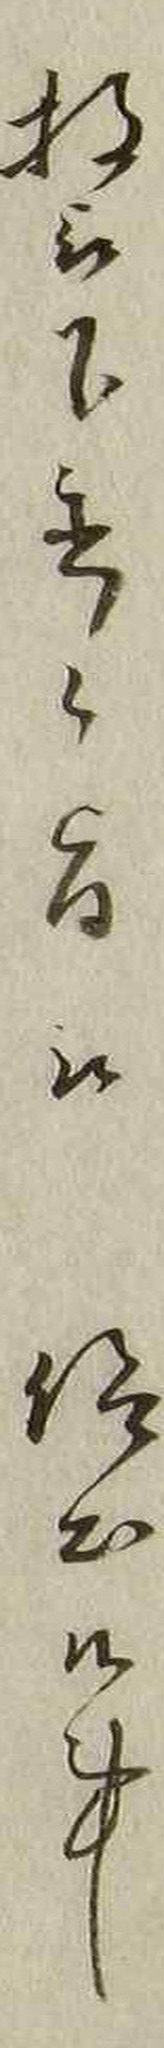枚被下置候旨被仰出候事
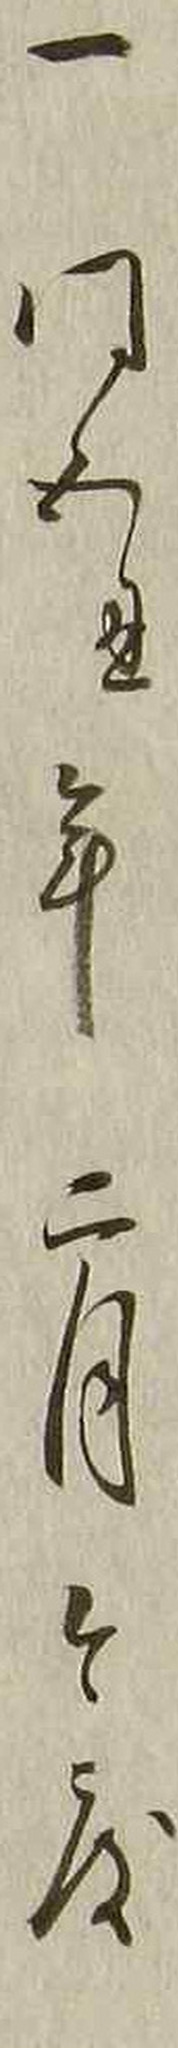一同五丑年二月今度
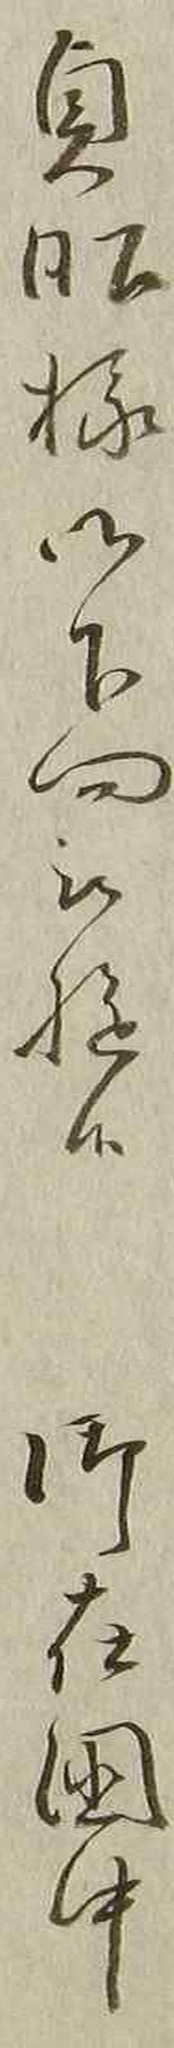貞昭様御下向被遊候御在国中
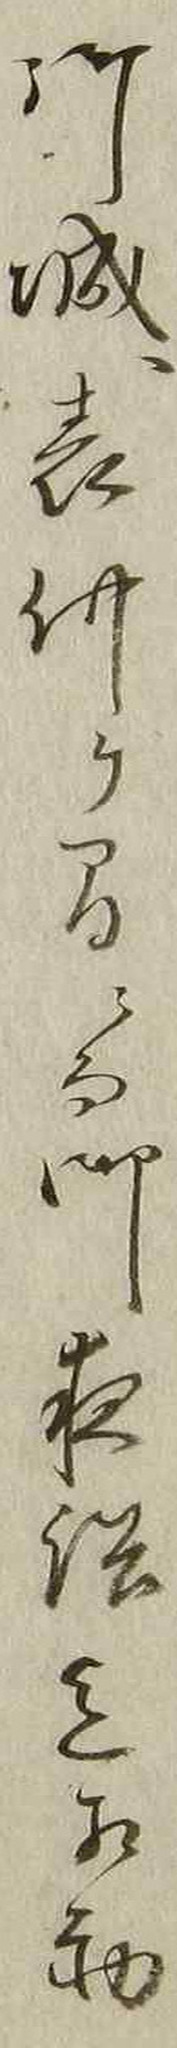御城へ表仲ケ間ニ而御夜詰迄相勤
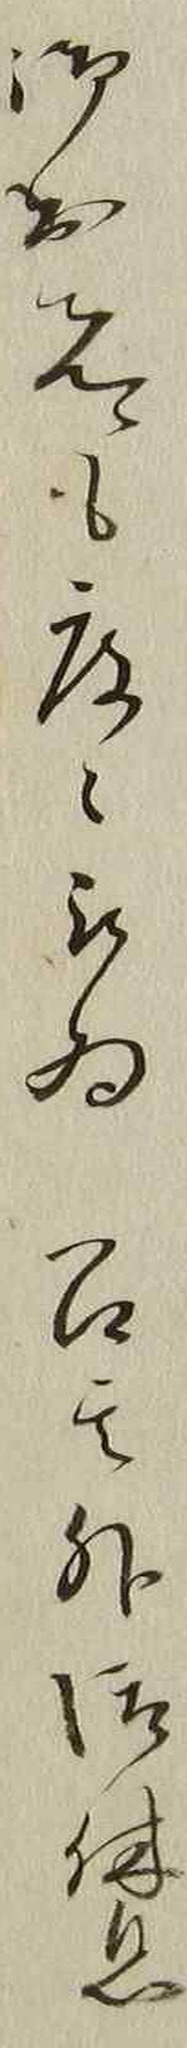御出先へも度々被為召其外御休息
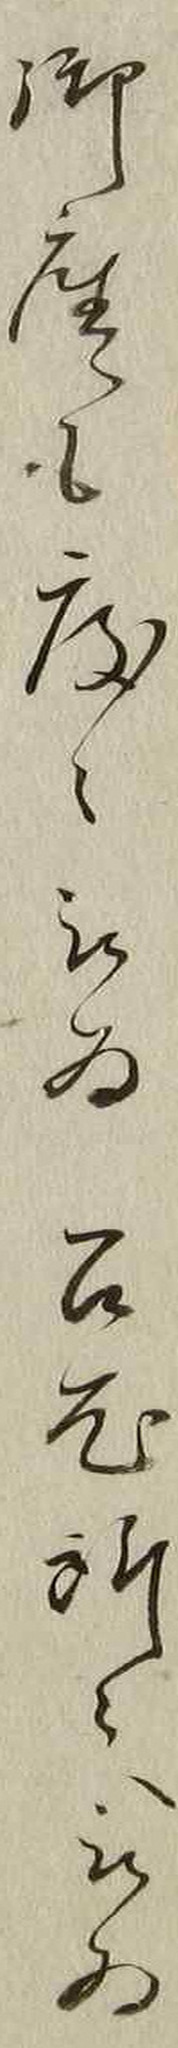御座へも度々被為召尤所々へ被為
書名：諸士系譜　巻之25　い之部25
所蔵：会津若松市立会津図書館
